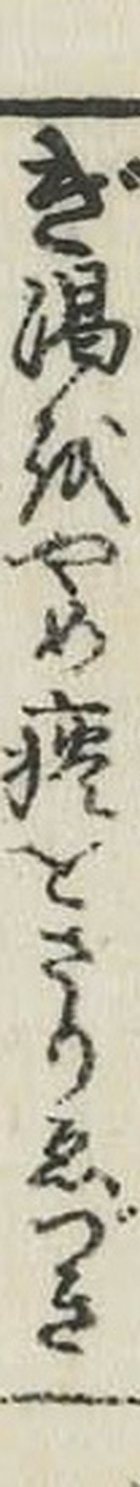ぎ渇をやめ痰をさりゑづき
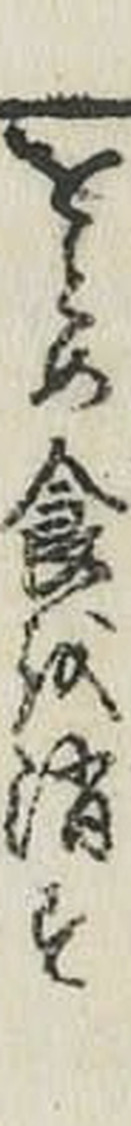をとめ食を消す
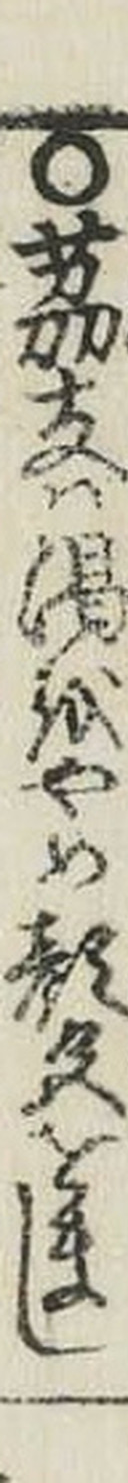○茘支は渇をやめ顔色をまし
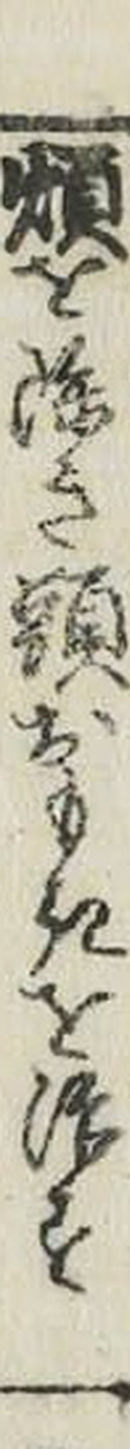煩を除き頭おもきを治す
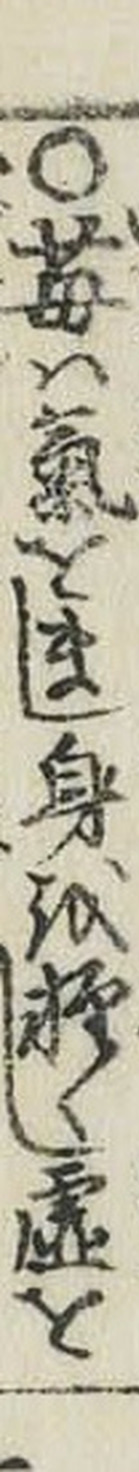○苺は気をまし身を強くし虚を
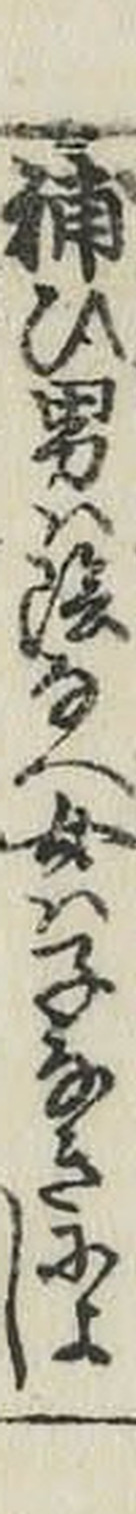補ひ男は陰なへ女は子なきによし
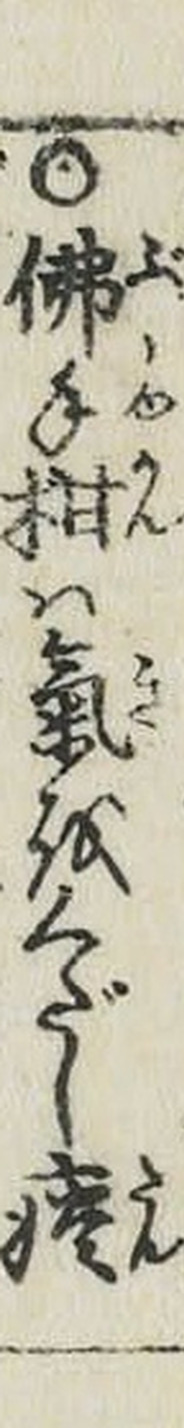○仏手柑は気をくだし痰
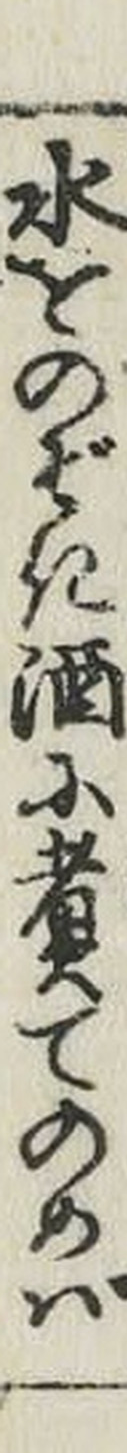水をのぞき酒に煮てのめば
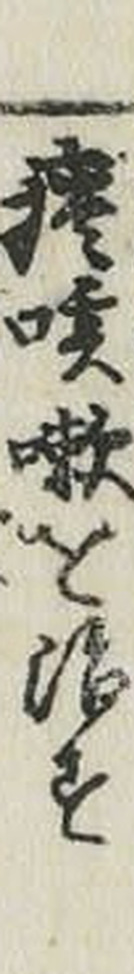痰咳嗽を治す
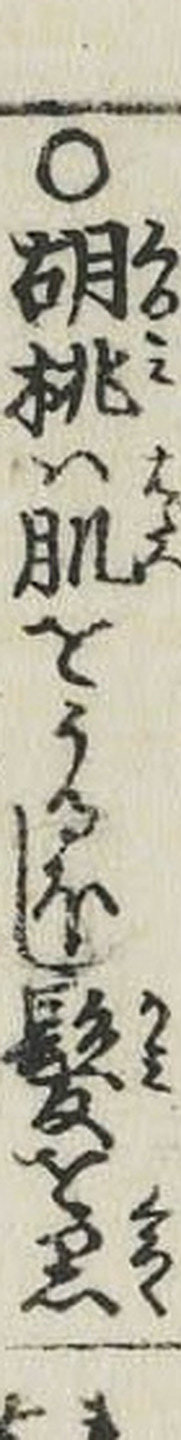○胡桃は肌をうるほし髪を黒
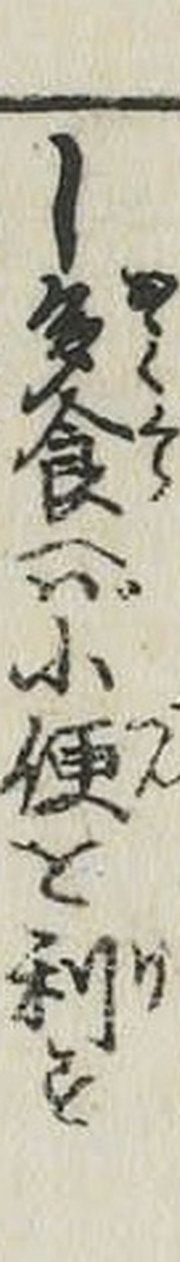し多食へば小便を利す
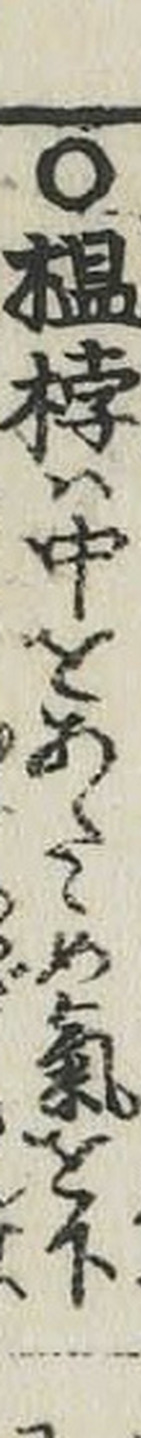○榲桲は中をあたゝめ気を下
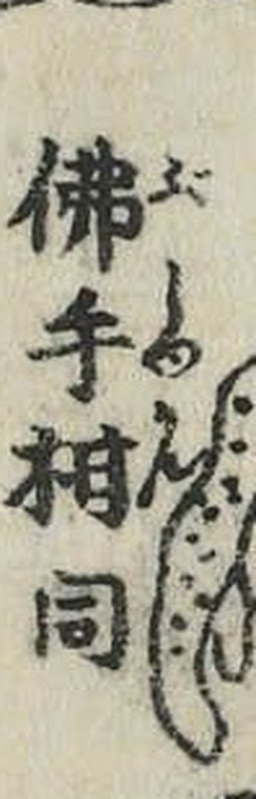仏手柑同
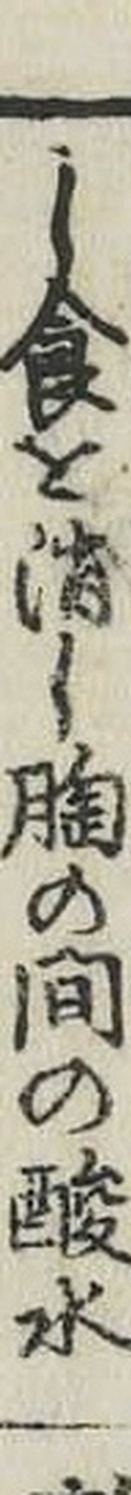し食を消し胸の間の酸水

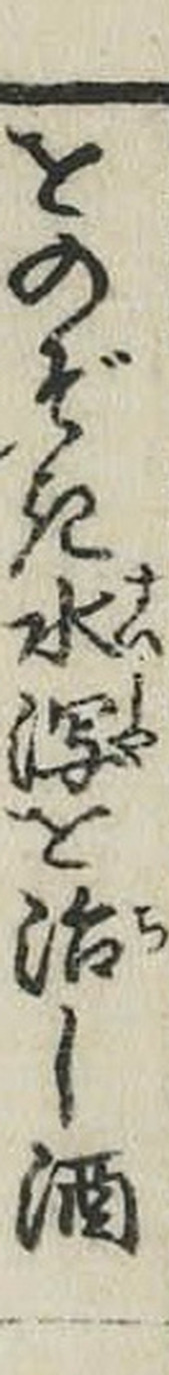をのぞき水瀉を治し酒
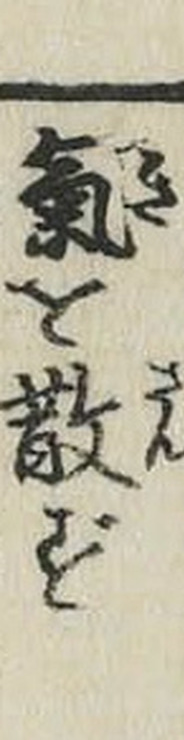気を散ず
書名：増補頭書訓蒙図彙大成 10巻 8:巻之17-19
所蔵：東京学芸大学教育コンテンツアーカイブ
